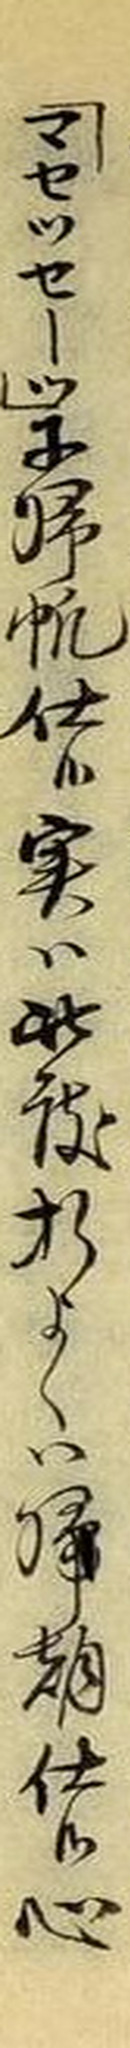「マセツセーツ」に帰帆仕候実ハ此度折よくハ帰朝仕候心
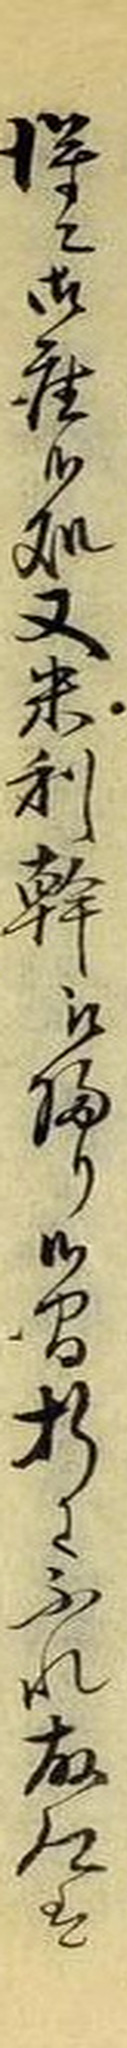得ニ御座候処又メリカ江帰り候間折にふれ故郷は
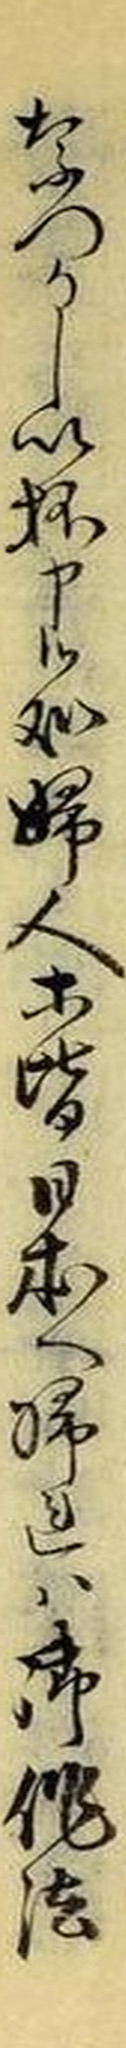なつかしい抔申候処婦人等皆日本へ帰るハ御作法
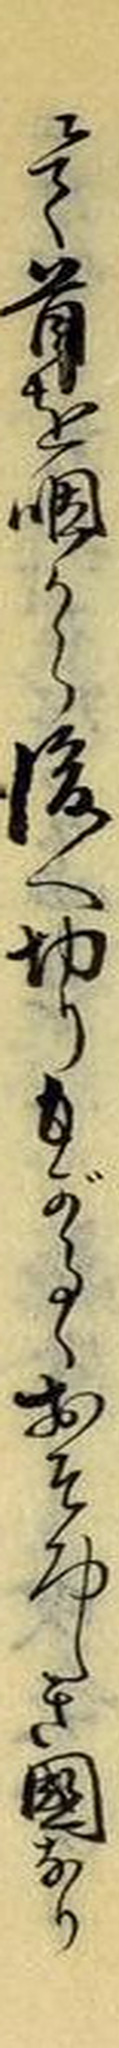ニて首を咽から後へ切りもがるゝおそろしき国なり
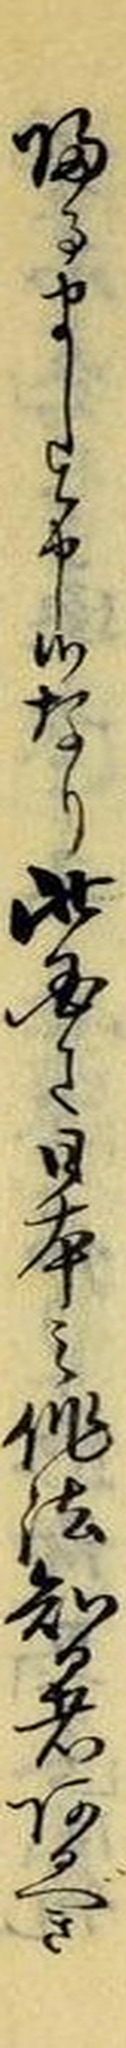帰るましと申候なり此国に日本之作法知る者あるべき
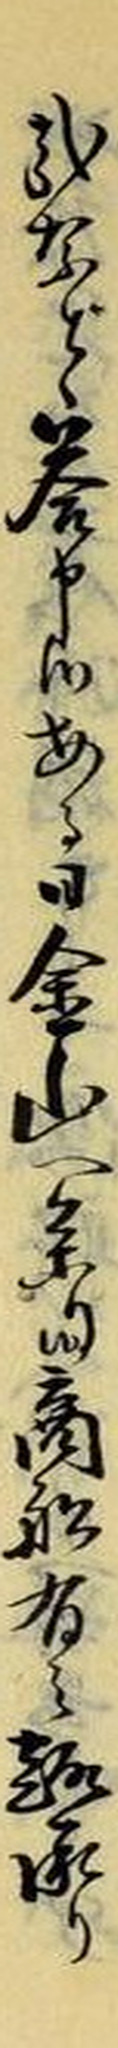哉などゝ答申候ある日金山へ参り候商船有之趣承り
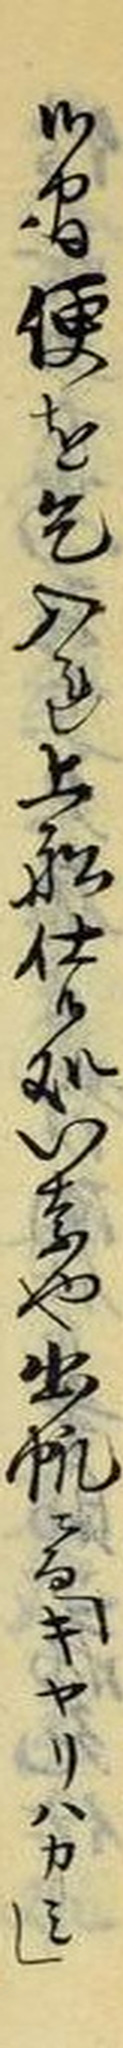候間便を乞入進上船仕候処いまや出帆ニ而「キヤリハカミ」
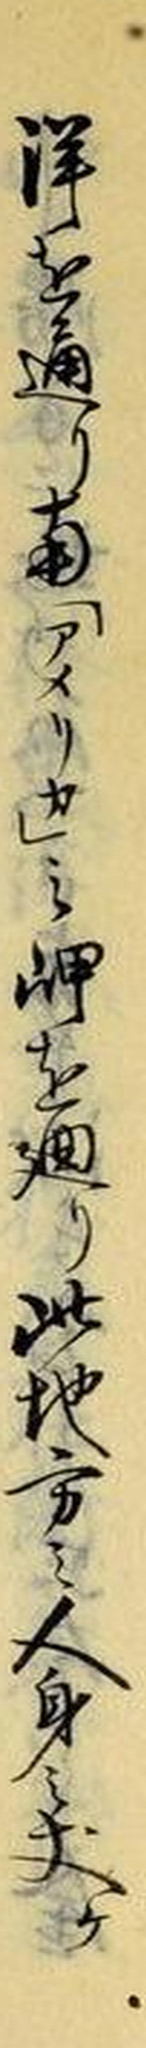洋を通り南「アメリカ」の岬を廻り此地方之人身之丈ケ
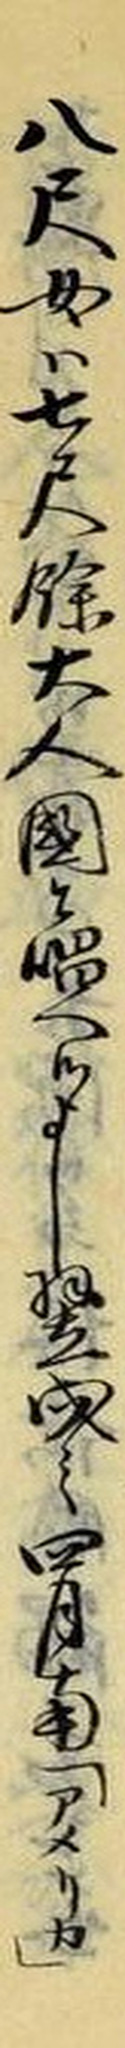八尺女ハ七尺余大人国と唱へ候よし翌亥之四月南「アメリカ」
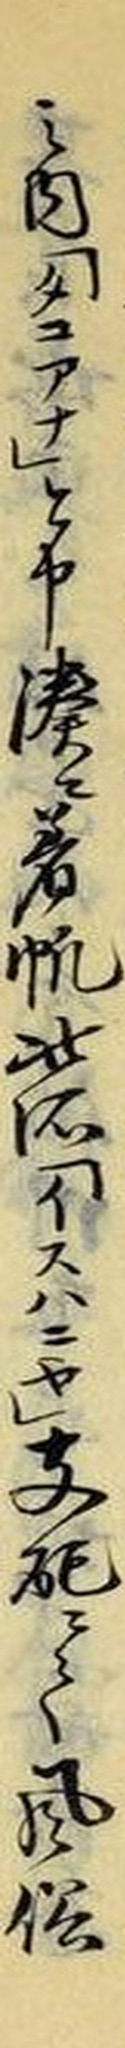之内「タコアナ」と申湊ニ着帆此所「イスハニヤ」支配ニて風俗
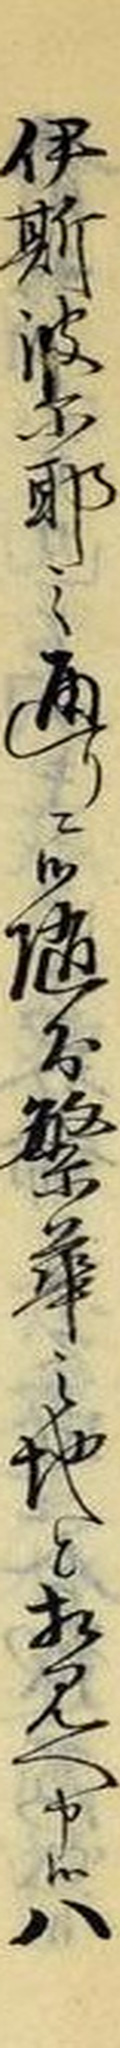イスハニヤ之通りニ候随分繁華之地と相見へ申候八
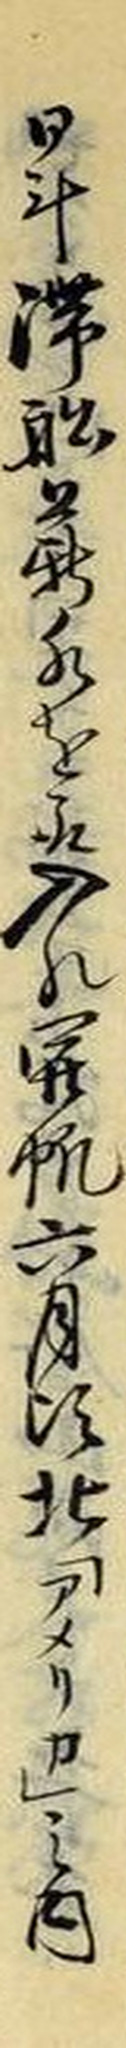日計滞船薪水を取入れ開帆六月頃北「アメリカ」之内
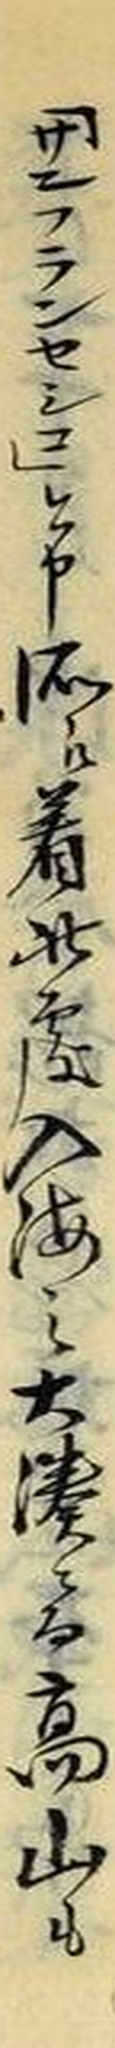「サンフランセシコ」と申所江着此處入海之大湊ニ而高山も
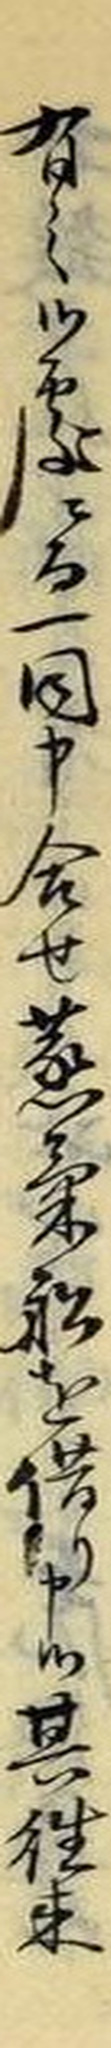有之候處ニ而一同申合せ蒸気船を借り申候其往来
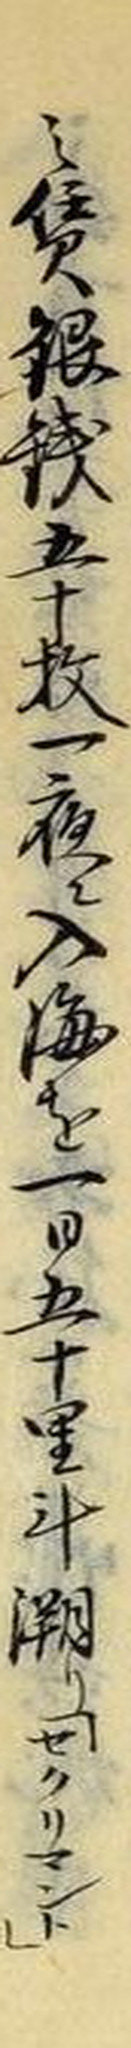之賃銀銭五十枚一夜に入海を一日五十里計溯り「セクリマント
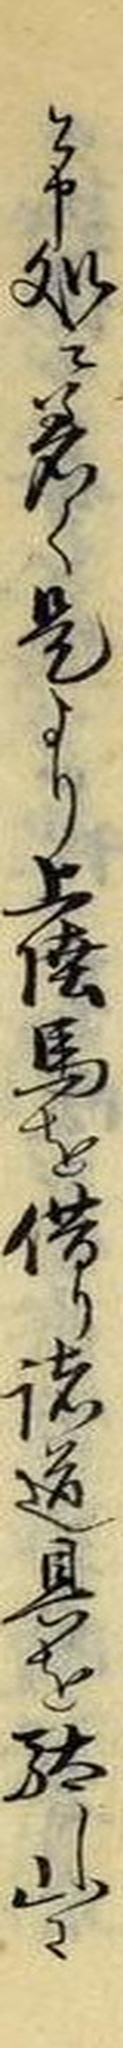と申処ニ着く是より上陸馬を借り諸道具を駄し山に
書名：漂客談奇（備考雑録写8）
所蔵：福井県文書館 Fukui Prefectural Archives
